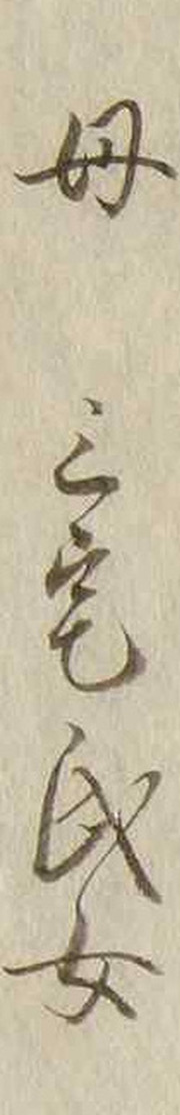母三宅氏女

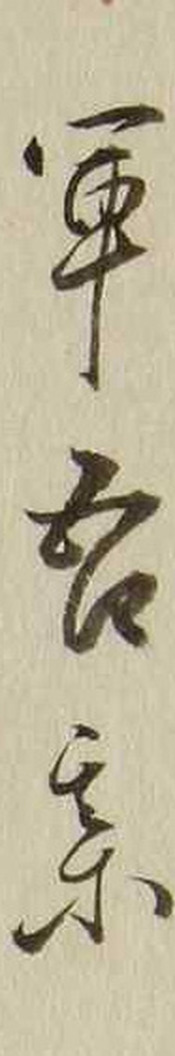軍吾某
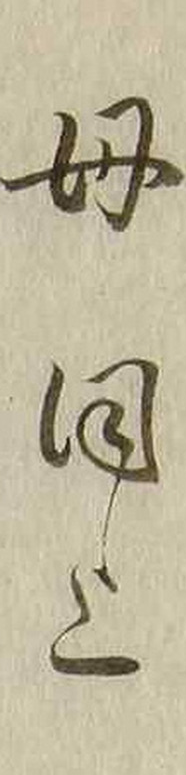母同上
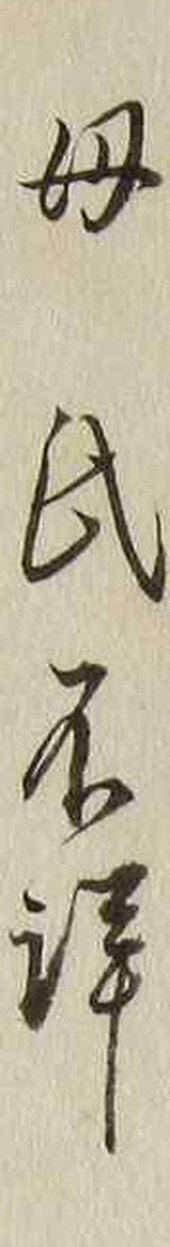母氏不詳
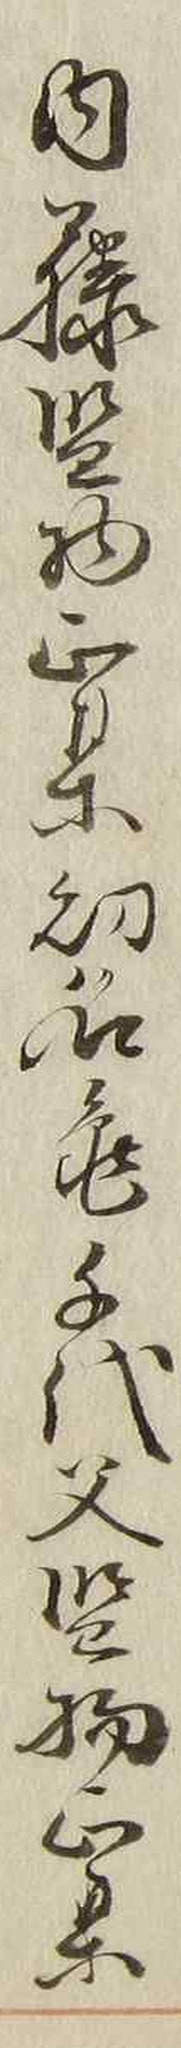内藤監物正某幼名亀千代父監物正某
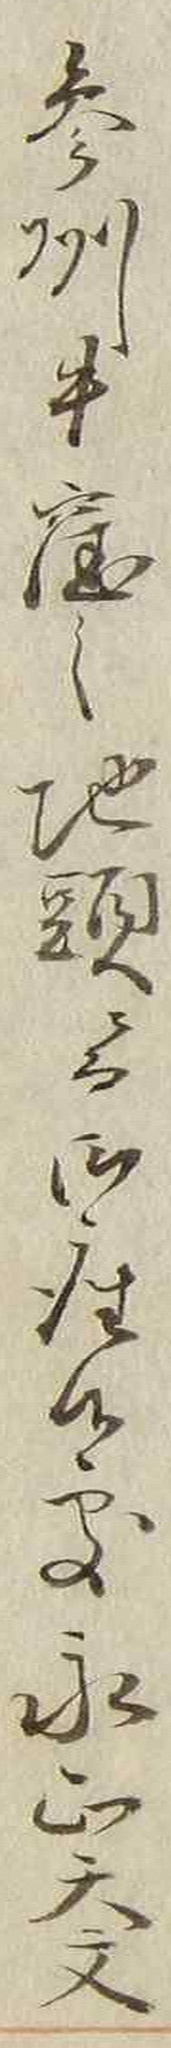参州牛窪之地頭ニ而御座候処永正天文
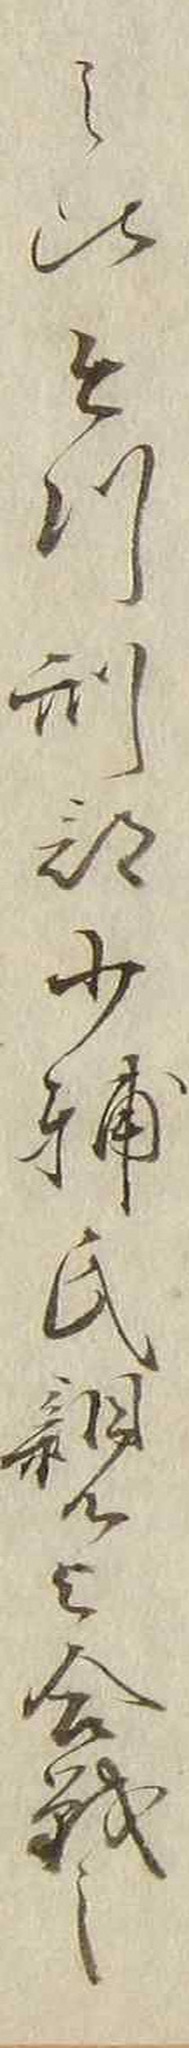之頃今川刑部少輔氏親与合戦之

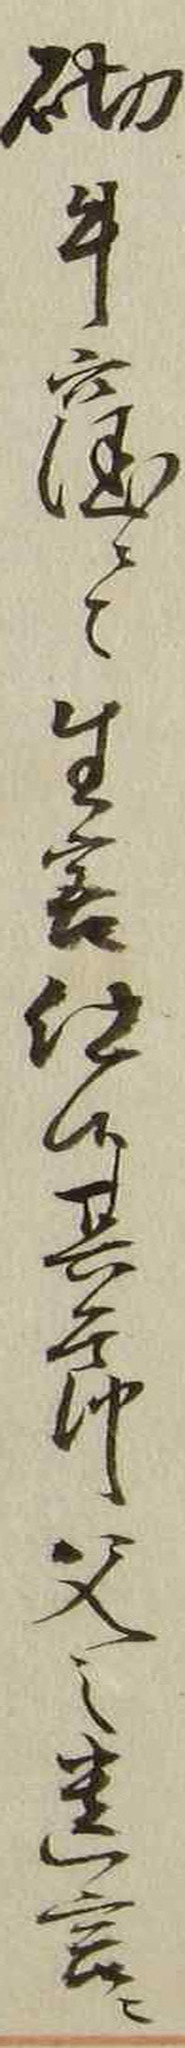砌牛窪ニて生害仕候其節父之遺言ニ
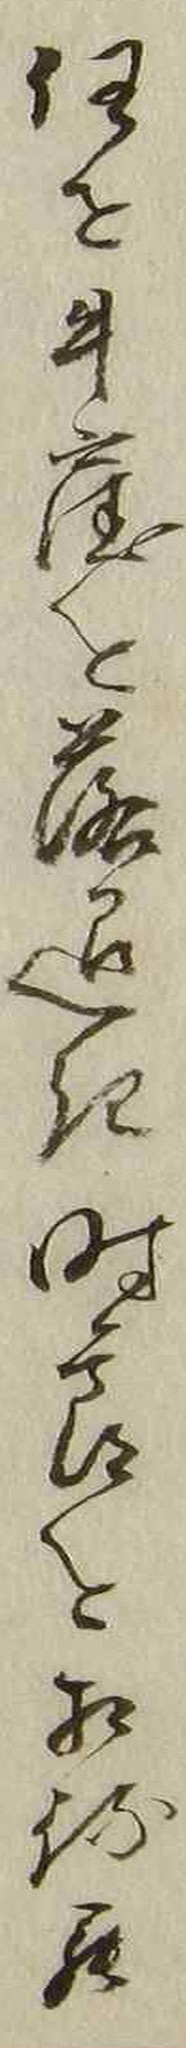任せ牛窪を落退き時節を相待罷
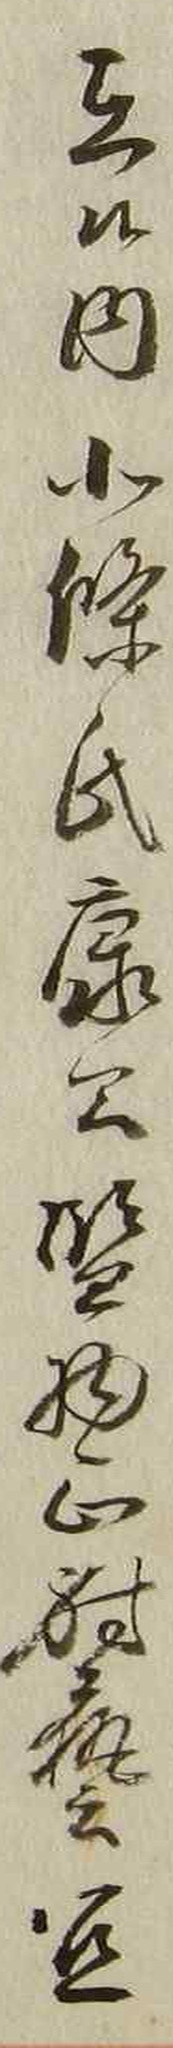立候内北条氏康公監物正射芸宜
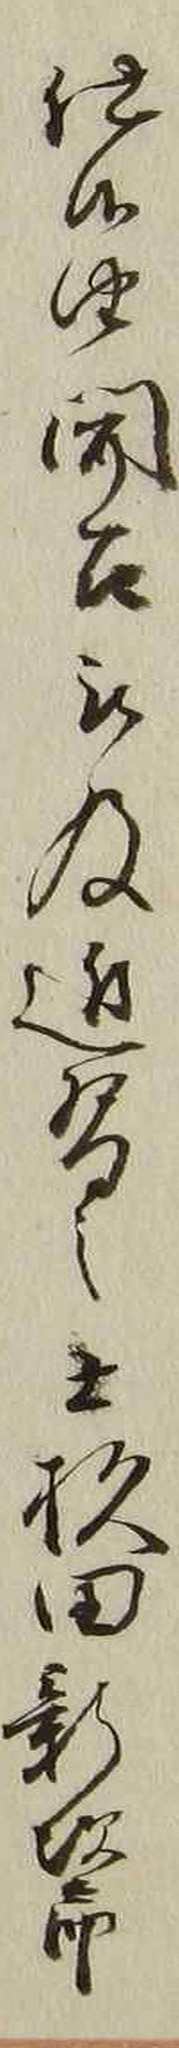仕候由聞召被及近皆之士杉田新次郎
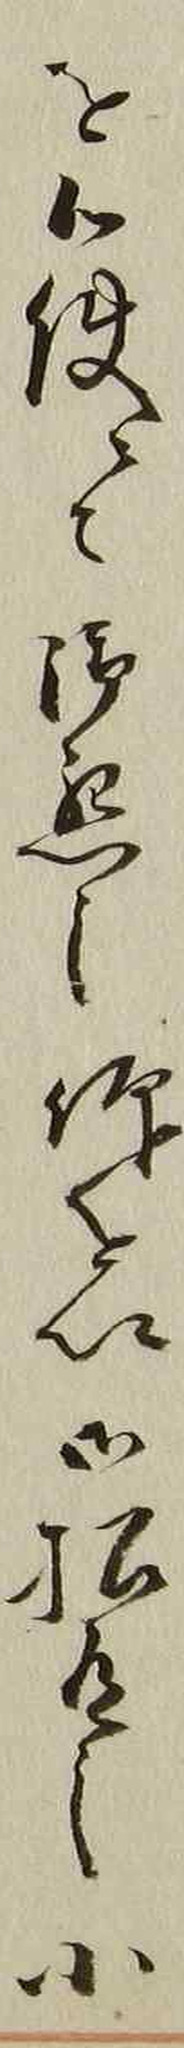を御使ニて御懇之仰を以御招有之小
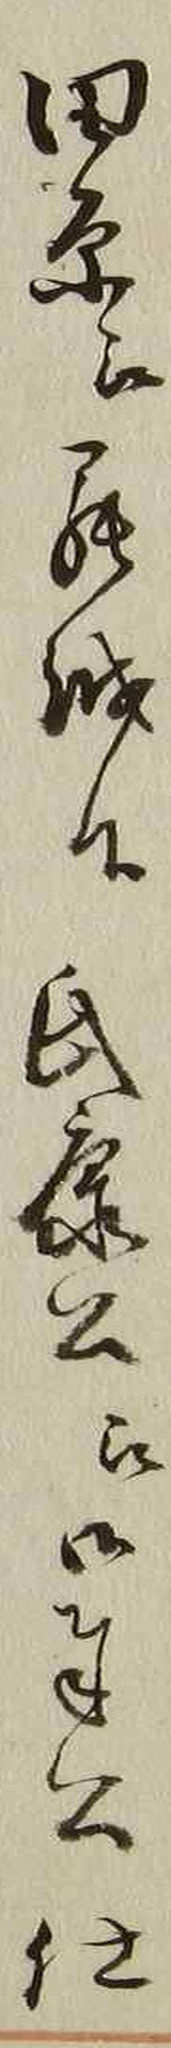田原江罷越候氏康公江御奉公仕
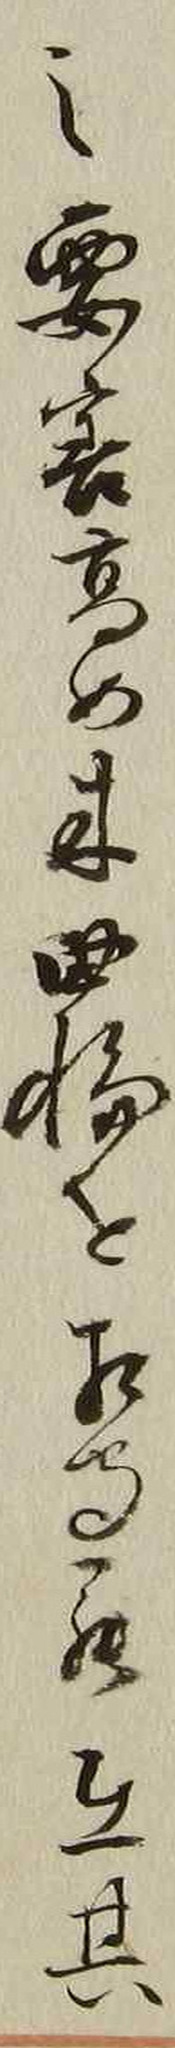之要害高め木曲輪を相守罷在其
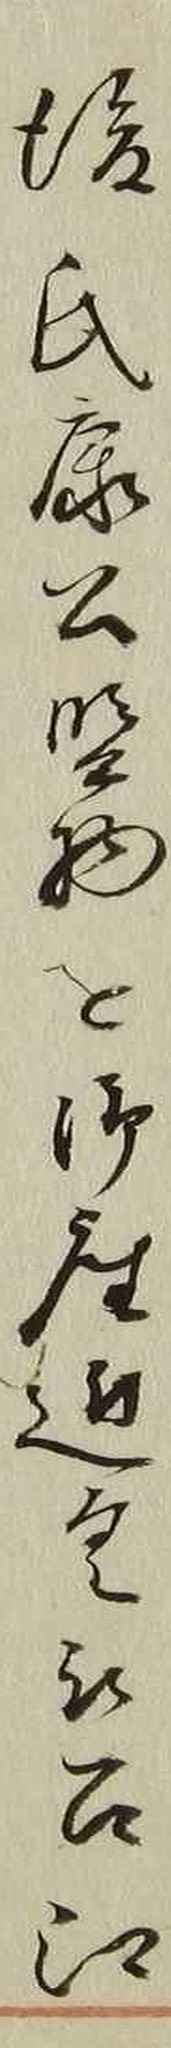後氏康公監物を御座近く被召江
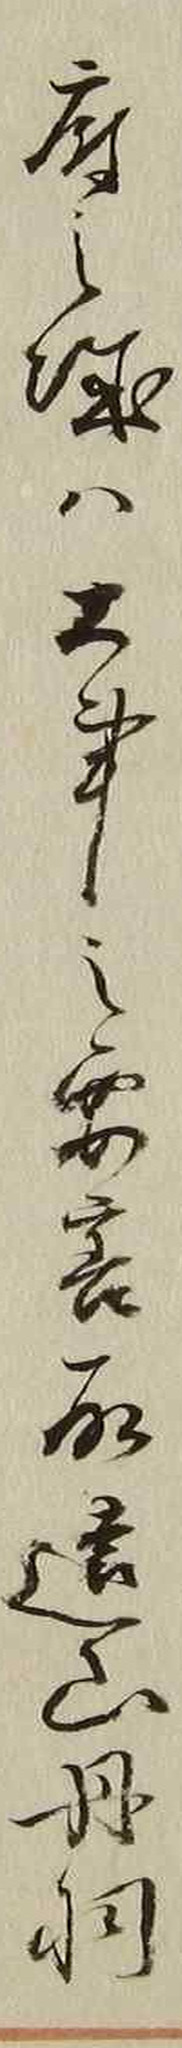府之城ハ大事之要害故遠山丹羽
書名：諸士系譜　巻之122　よ之部5
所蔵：会津若松市立会津図書館
